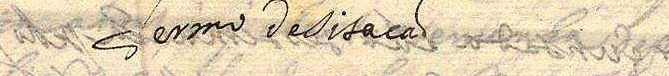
termo de sitacaõ
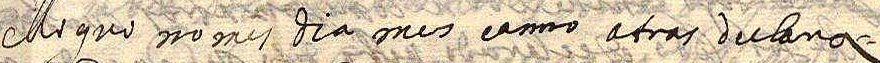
cheguo no mes dia mes e anno atras declara
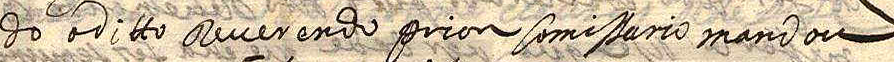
do o ditto Reuerendo prior Comissario mandou
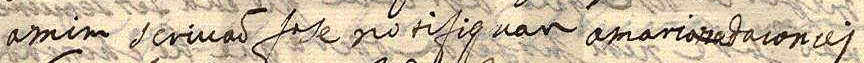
a mim scriuaõ fose notifiquan a mariana da concej
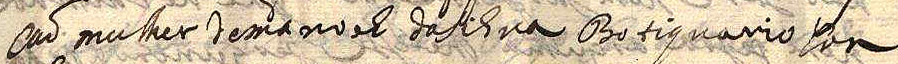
caõ mulher de manoel da silva Botiquario con
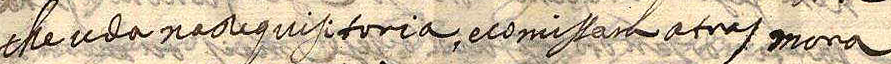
theuda na Requisitoria, e comissara atras mora
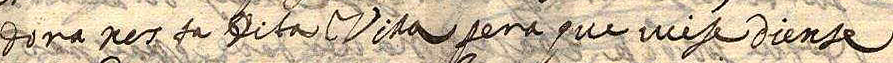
dora nesta dita Villa pera que uiese diente
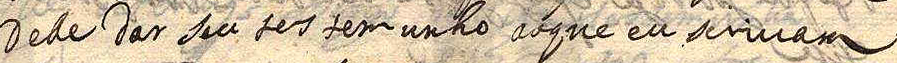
Delle dar seu testemunho ao que eu scriuam
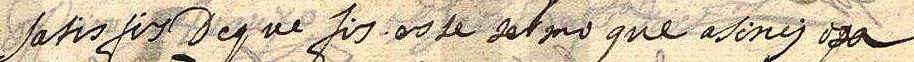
satisfis De que fis este termo que asinej o pa
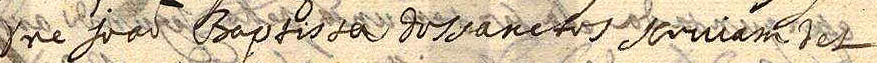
dre joaõ Baptista dos sanctos scriuam des
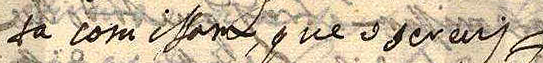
ta comissam, que o screuj
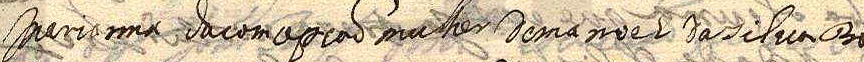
Mariama da comcepcaõ mulher De manoel da silua Bo
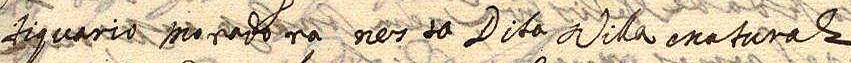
tiquario moradora nesta Dita Villa e natural
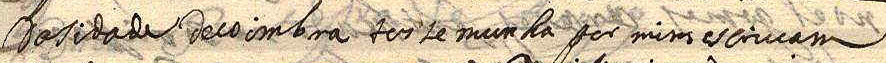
da sidade de coimbra testemunha por mim escriuam
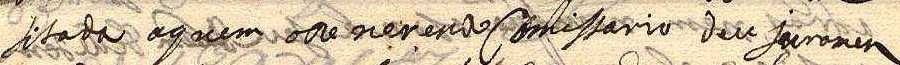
sitada a quem o Reverendo Comissario seu juramen
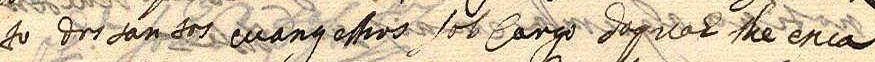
to dos santos euangelhos sob Cargo do qual lhe enca
